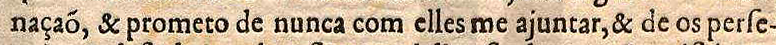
naçaõ, & prometo de nunca com elles me ajuntar, & de os perse
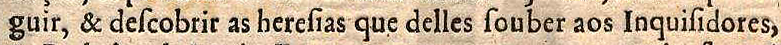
guir, & descobrir as heresias que delles souber aos Inquisidores,
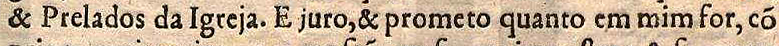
& Prelados da Igreja. E juro, & prometo quanto em mim for, cō
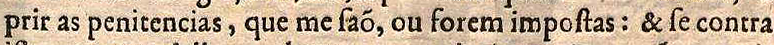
prir as penitencias, que me saõ, ou forem impostas: & se contra
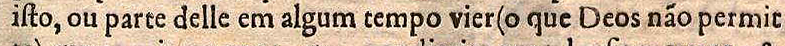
isto, ou parte delle em algum tempo vier (o que Deos não permit
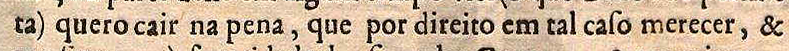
ta) quero cair na pena, que por direito em tal caso merecer, &
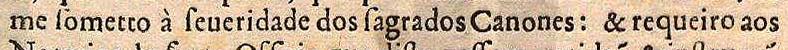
me sometto à seueridade dos sagrados Canones: & requeiro aos
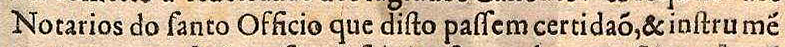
Notarios do santo Officio que disto passem certidaõ, & instrumē
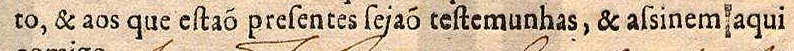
to, & aos que estaõ presentes sejaõ testemunhas, & assinem aqui
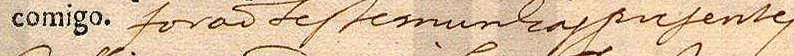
comigo. foraõ testemunhas presentes
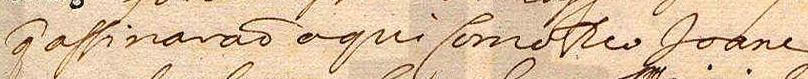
q̄ assinaraõ aqui Com o Reo Joane
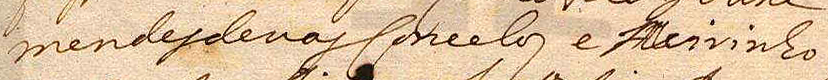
mendes de uasConcelos e Meirinho
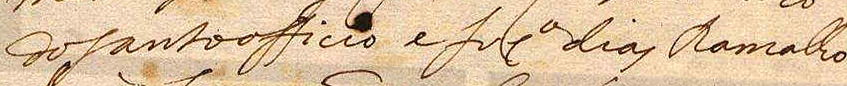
do santo officio e frco dias Ramalho
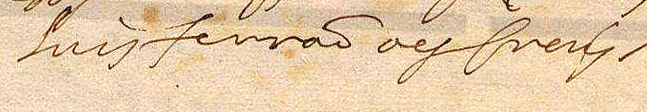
Luis ferraõ o esCreuj /
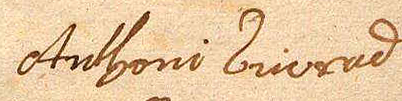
Anthoni Guirad
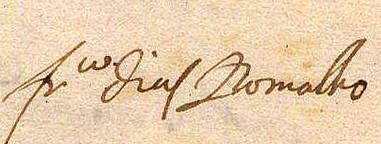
frco dias Romalho
